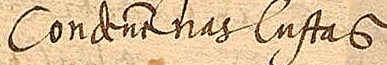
Conden̄e nas Custas
